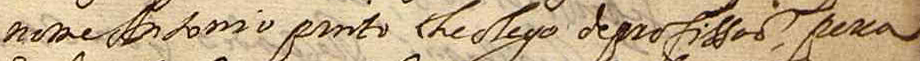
nome Antonio pinto theolego de profissaõ, pera
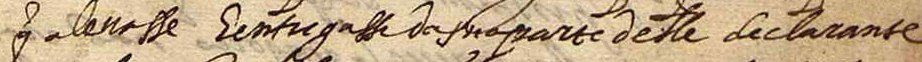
q̄ a leuasse E entregasse da sua parte delle declarante
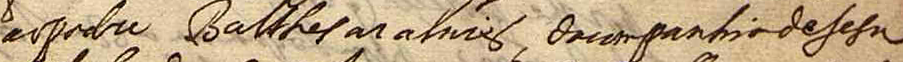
ao padre Balthesar alures, da companhia de Jesu
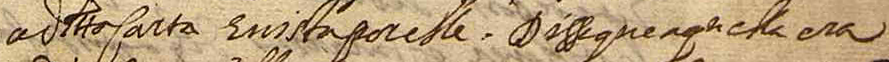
a ditta Carta E uista por elle. Disse que aquella era
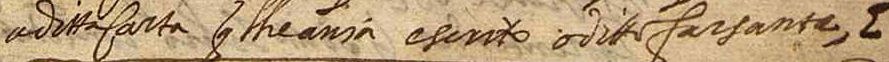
a ditta Carta q̄ lhe auia escrito o ditto farsante, E
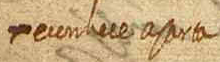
reconhece a Carta
